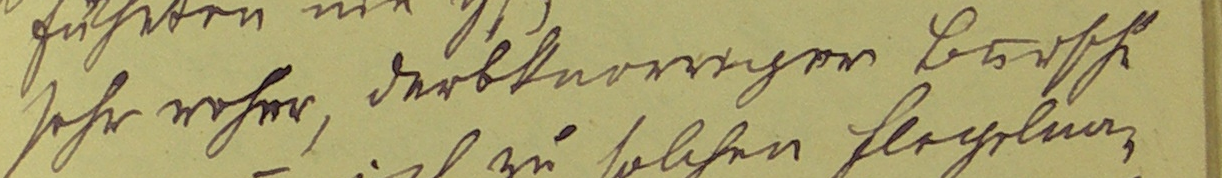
sehr roher, derbknorriger Bursche
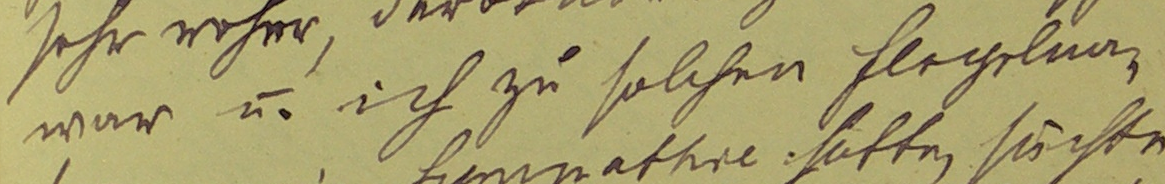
war u. ich zu solchen Flegelna¬
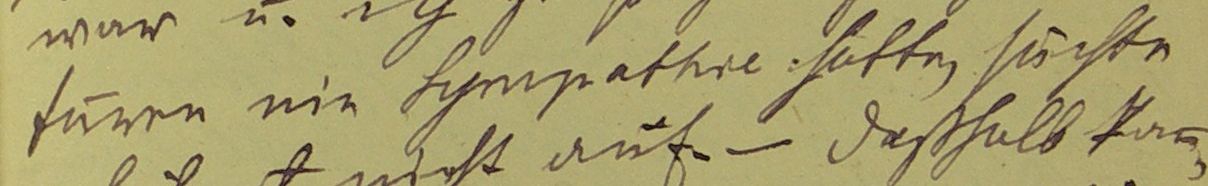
turen nie ??? hatte, suchte
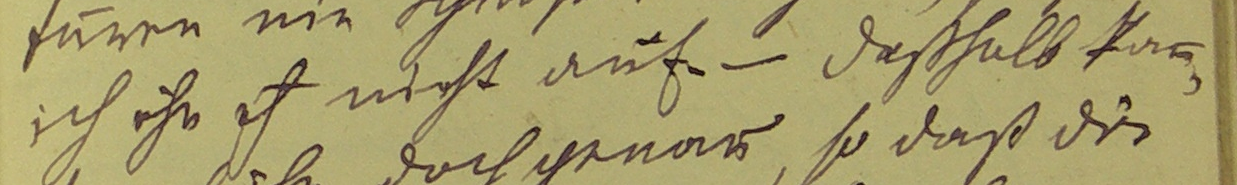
ich ihn ch nicht auf.- deßhalb kann¬
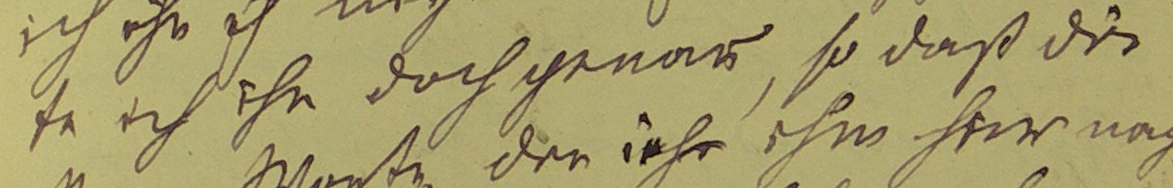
te ich ihn doch genauer, so daß die
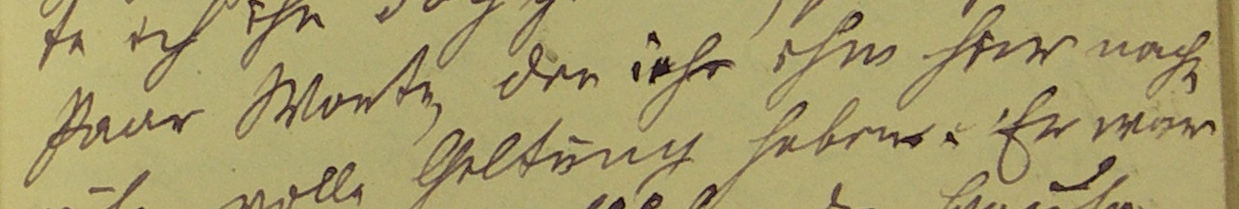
Paar Worte , die ich ihm hier nach¬
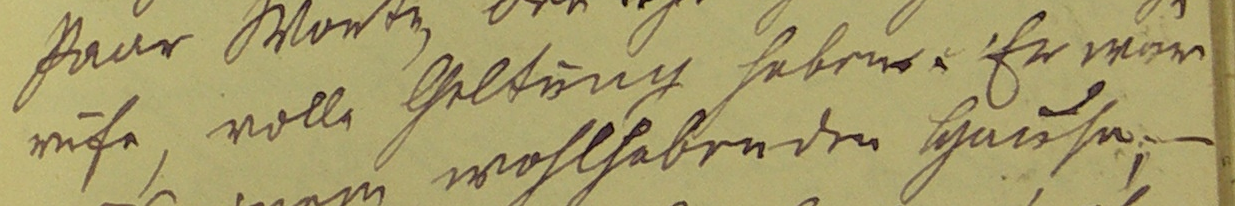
rufe, volle Geltung haben. Er war
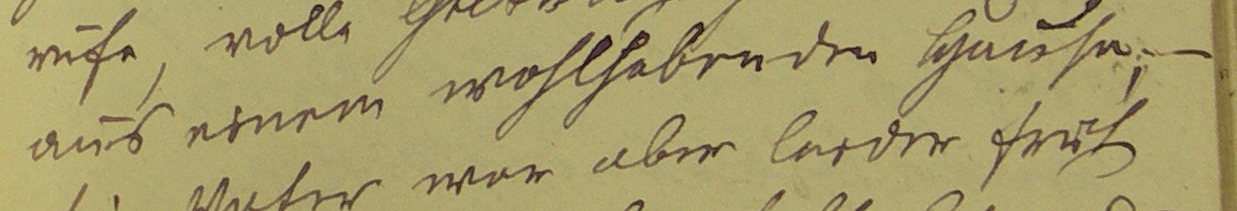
aus einem wohlhabenden Hause, –
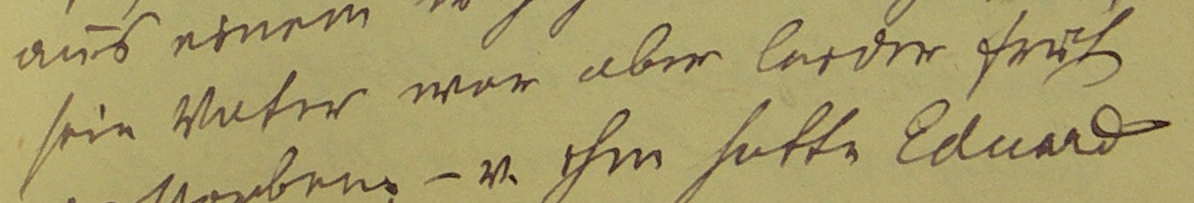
sein Vater war aber leider früh
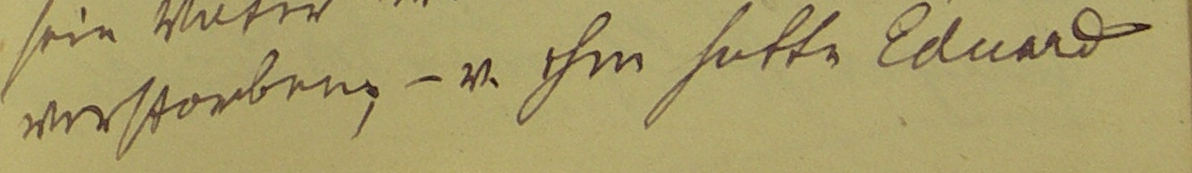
verstorben,- v. ihm hatte ???
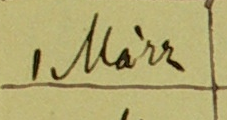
1. März
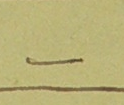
-
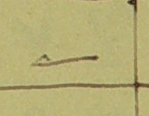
-
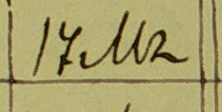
17. Mr.
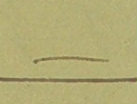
-
